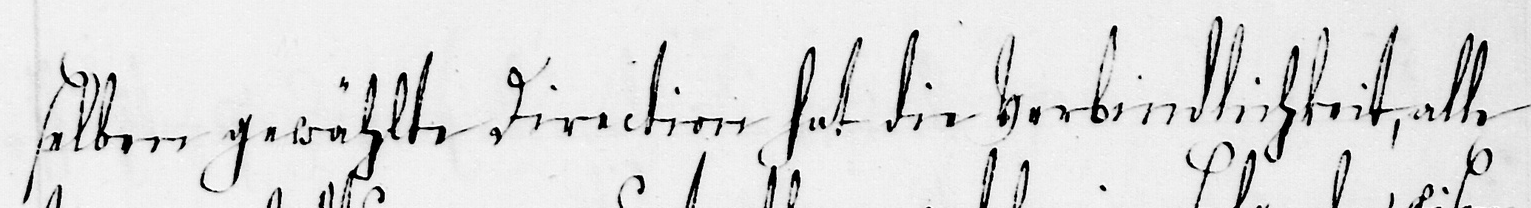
selben gewählte Direction hat die Verbindlichkeit, al¬
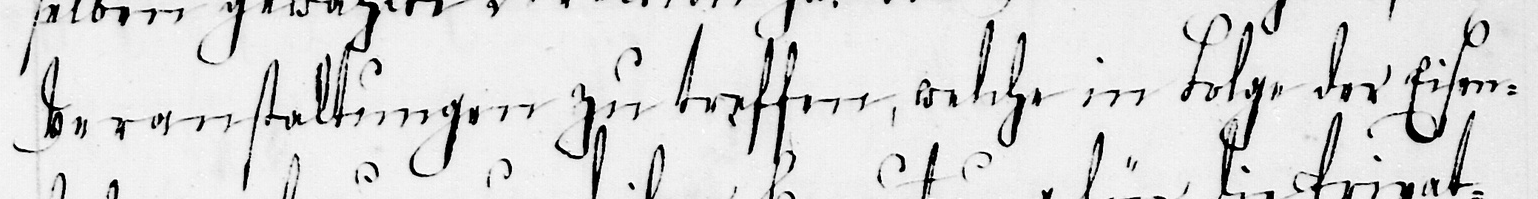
Veranstaltungen zu treffen, welche in Folge der Eisen¬
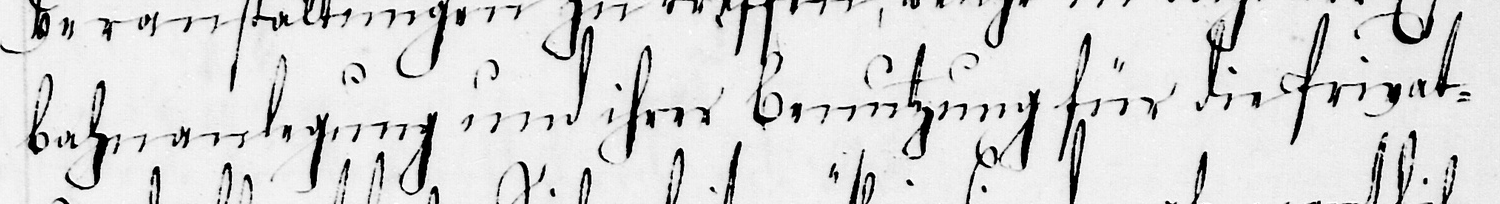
bahnanlegung und ihrer Benutzung für die Privat-
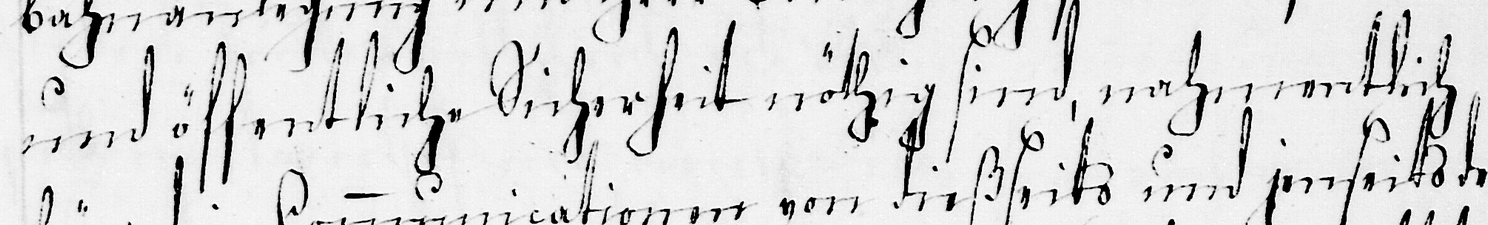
und öffentliche Sicherheit nöthig sind, nahmentlich
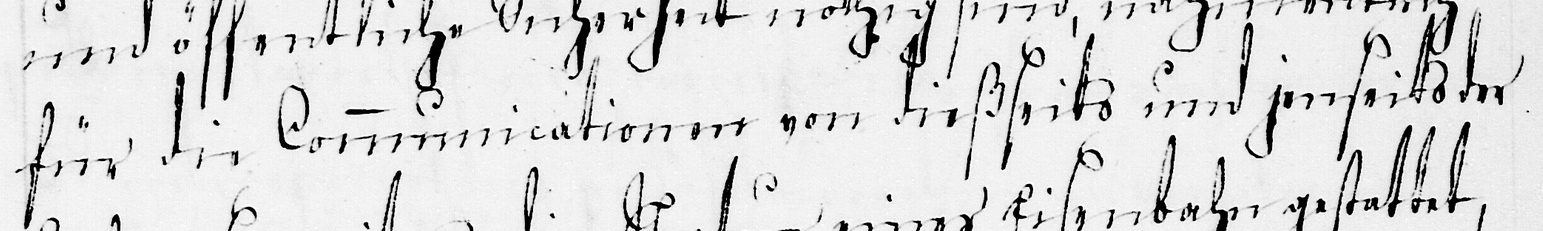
für die Communicationen von dießseits und jenseits der
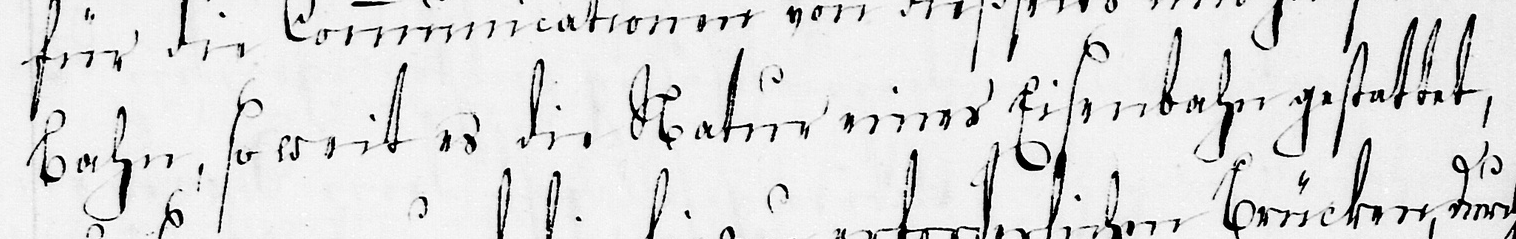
Bahn, soweit es die Natur einer Eisenbahn gestattet,
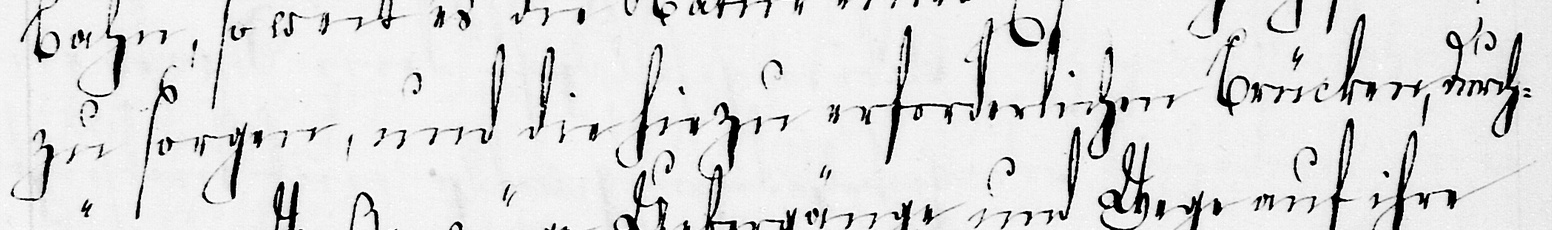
zu sorgen, und die hiezu erforderlichen Brücken, Durc¬
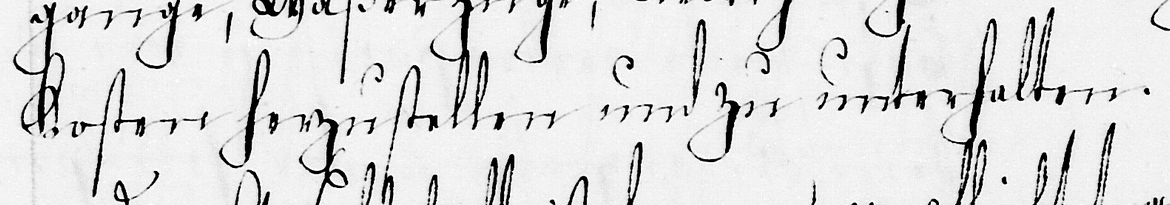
Kosten herzustellen und zu unterhalten.
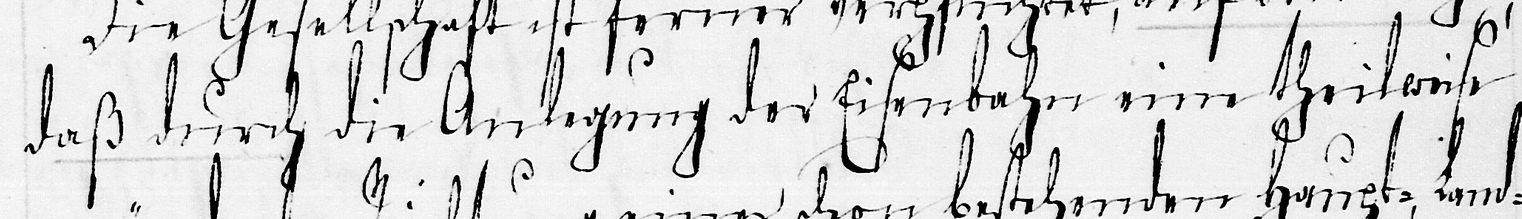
daß durch die Anlegung der Eisenbahn eine theilweise
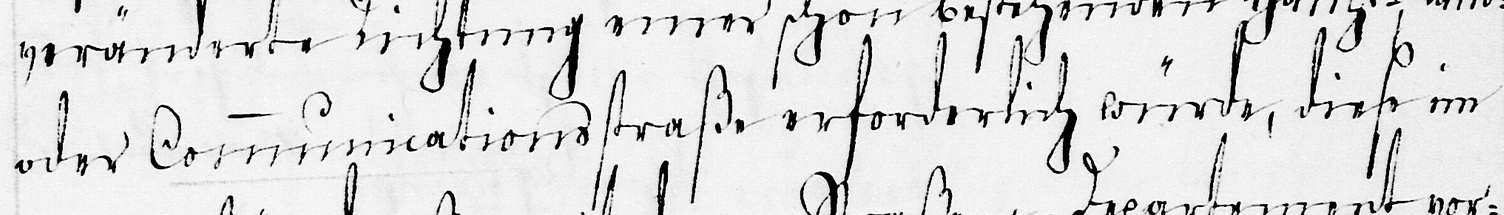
oder Communicationsstraße erforderlich würde, diese im
